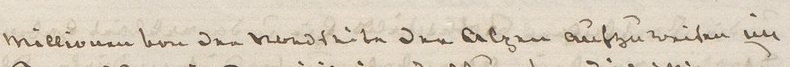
Millionen von der Nordseite der Alpen aufzuweisen im
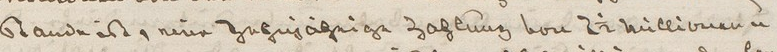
Stande ist, eine zehnjährige Zahlung von 2½ Millionen u
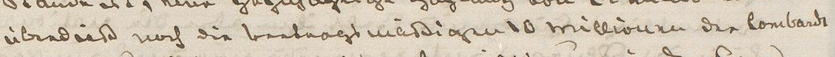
überdieß noch die vertragsmäßigen 10 Millionen der Lombardei
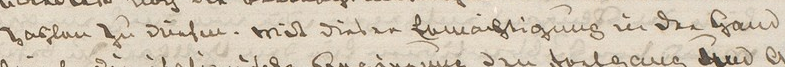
zahlen zu dürfen. Mit dieser Ermächtigung in der Hand
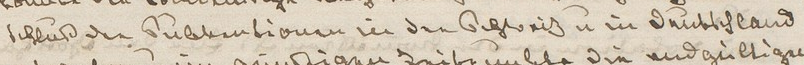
schluß der Subventionen in der Schweiz u in Deutschland
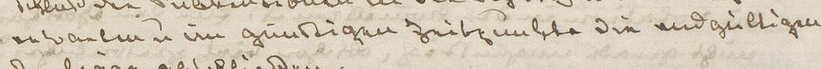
erwarten u im günstigen Zeitpunkte die endgültigen
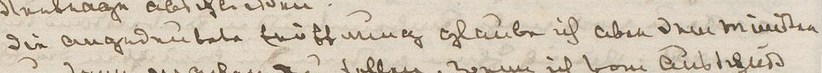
Die angedeutete Eröffnung glaube ich aber dem Minister
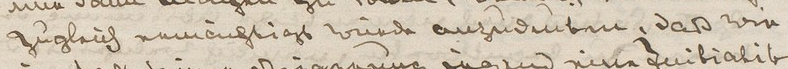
zugleich ermächtigt würde anzudeuten, daß wir
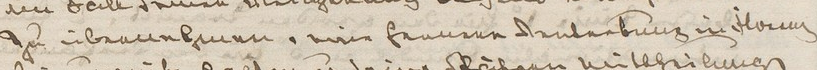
zu übernehmen, eine fernere Vertretung in Florenz
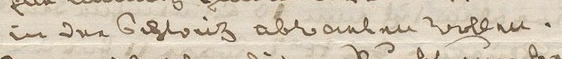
in der Schweiz abwarten wollen.
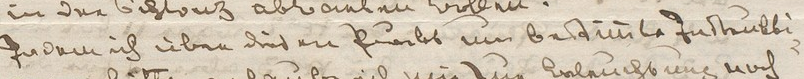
Indem ich über diesen Punkt um bestimmte Instrukti-
